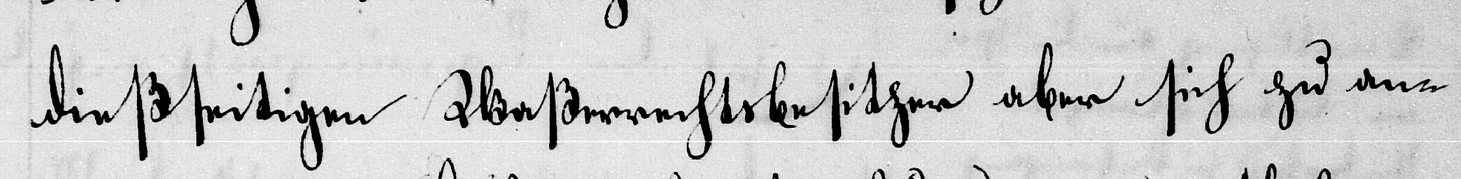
dießseitigen Waßerrechtsbesitzer aber sich zu an¬
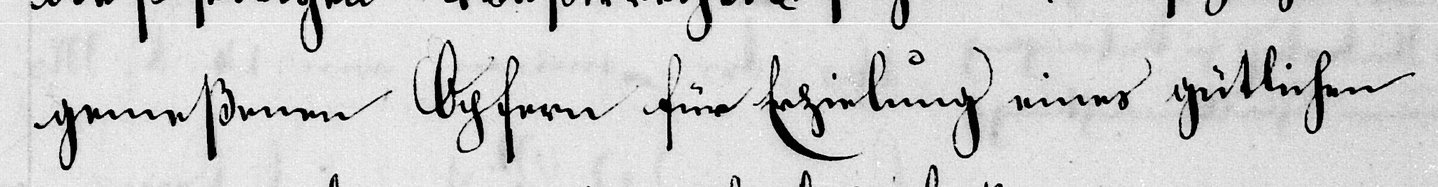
gemeßenen Opfern für Erzielung eines gütlichen
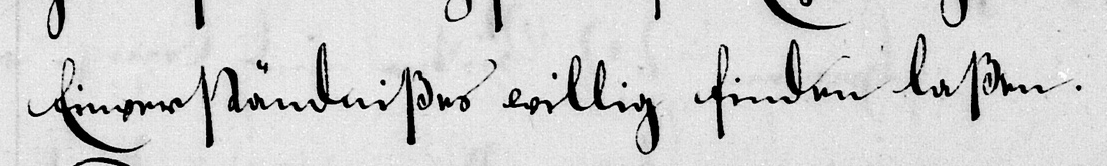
Einverständißes willig finden laßen.
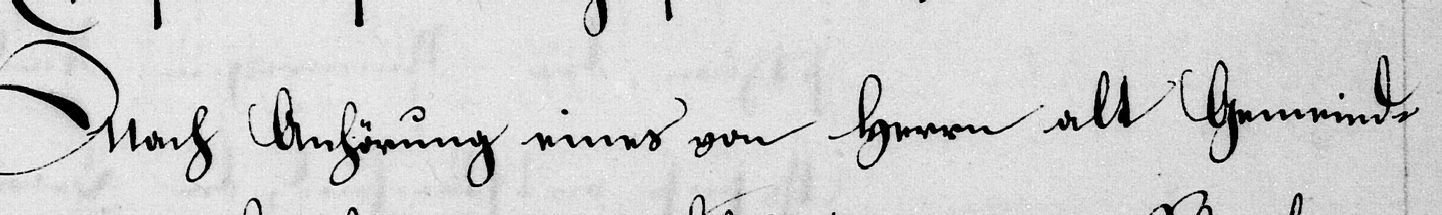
Nach Anhörung eines von Herrn alt Gemeind¬
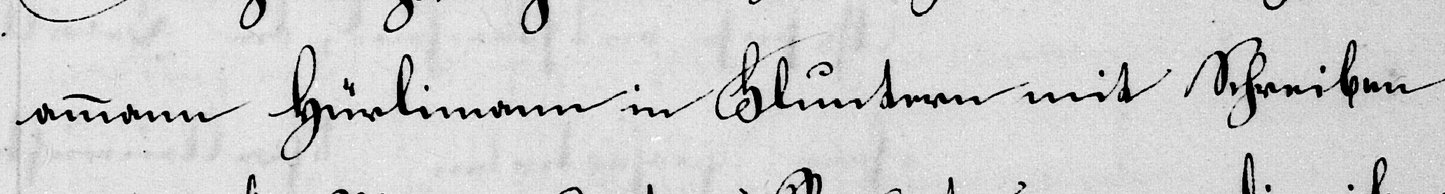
ammann Hürlimann in Fluntern mit Schreiben
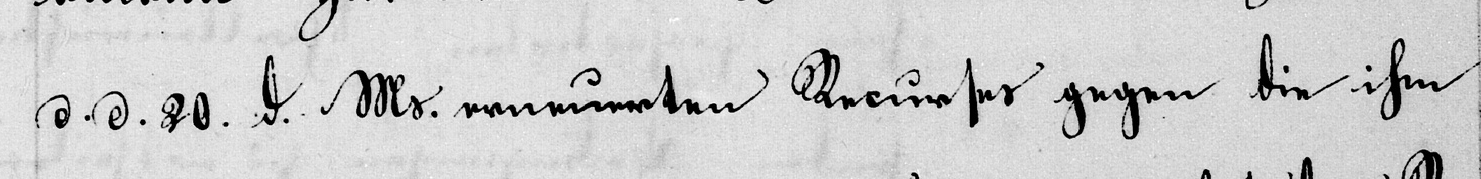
d. d. 20. d. Ms. erneuerten Recurses gegen die ihm
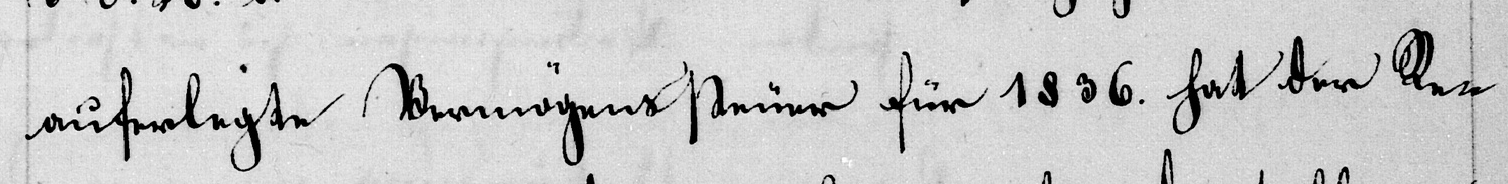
auferlegte Vermögenssteuer für 1836. hat der Re¬
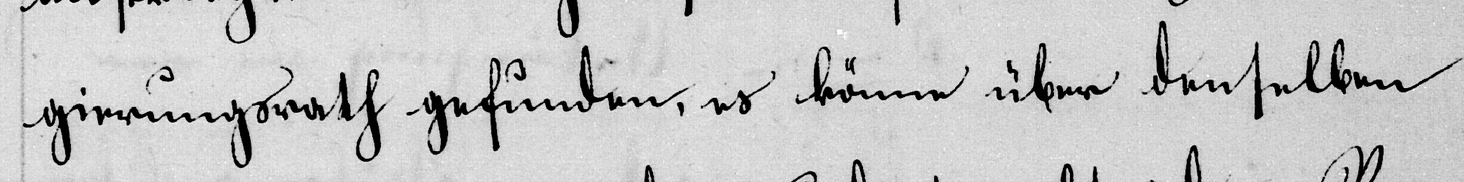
gierungsrath gefunden, es könne über denselben
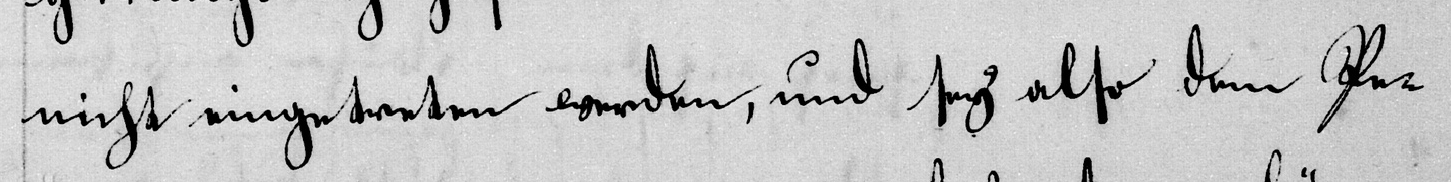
nicht eingetreten werden, und sey also dem Pe¬
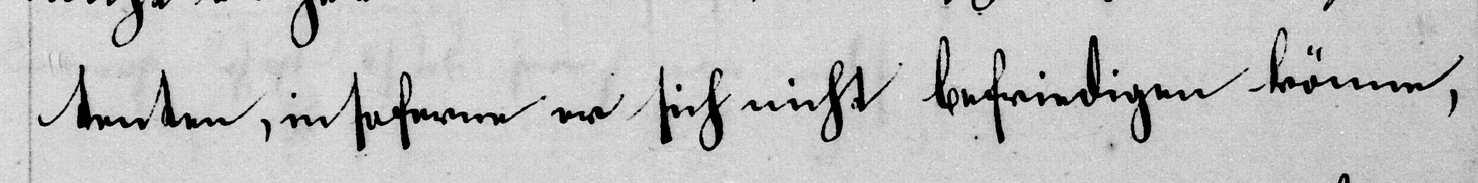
tenten, insofern er sich nicht befriedigen könne,
